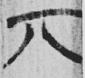亓（其）
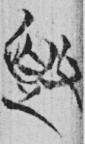○（輔）
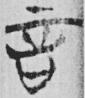言
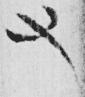又（有）
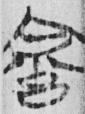○（序）
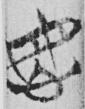悔
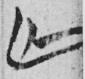亡
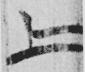上
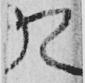九
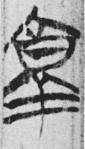○（敦）
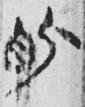艮
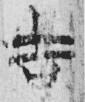吉
